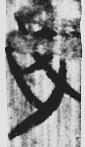𡚦（焉）
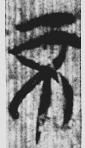不
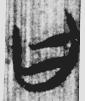曰
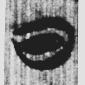日
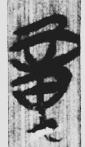章（彰）
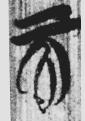而
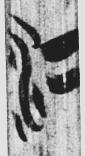冰
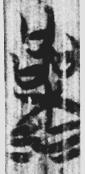澡（消）
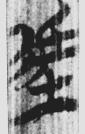○（乎）
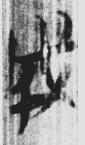道
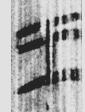王
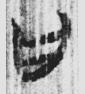曰
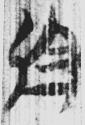於
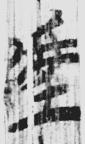𫊟
